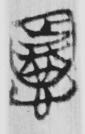{囗者心}
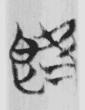既
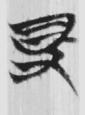𠭁
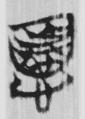{囗者心}
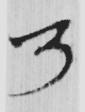乃
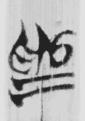爲
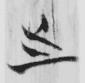之
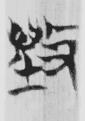毀
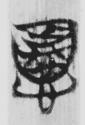{囗者心}
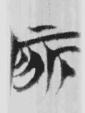所
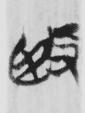臤
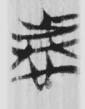者
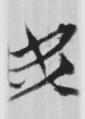𡚦
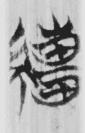{糸東田}
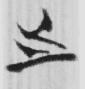之
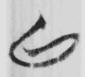㠯（以）
